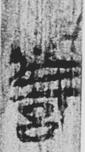○（雍）
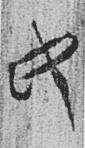女（汝）
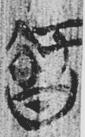○（知）
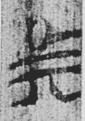者
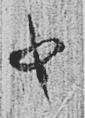中（仲）
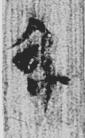弓
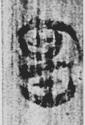○（答）
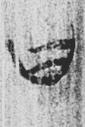曰
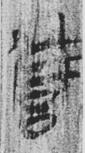○（雍）
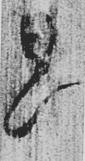也
